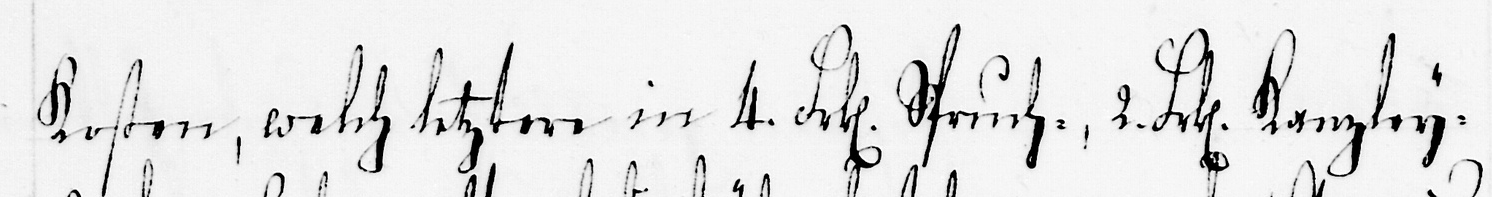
Kosten, welch letztere in 4. Frk[en]. Spruch-,
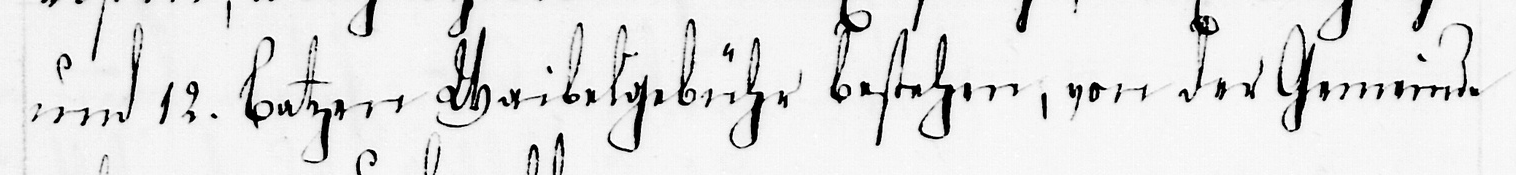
und 12. Batzen Waibelgebühr bestehen, von der Gemeinde
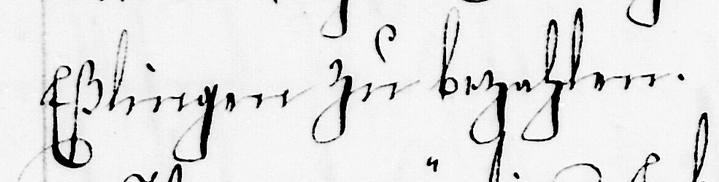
Eßlingen zu bezahlen.
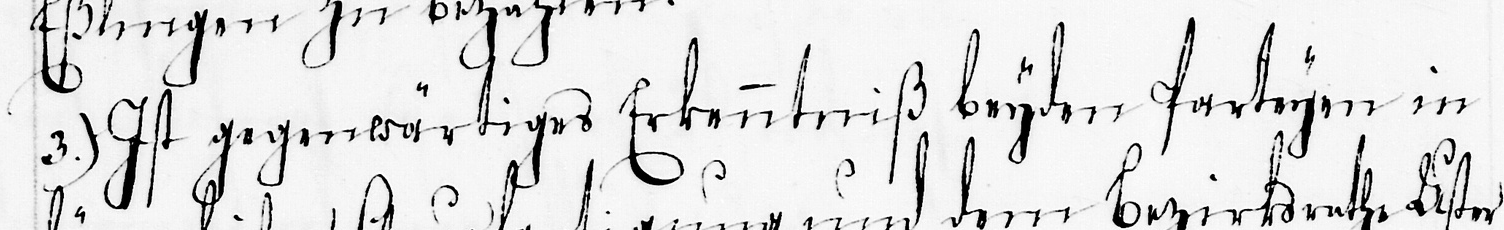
3.) Ist gegenwärtiges Erkenntniß beyden Parteyen in
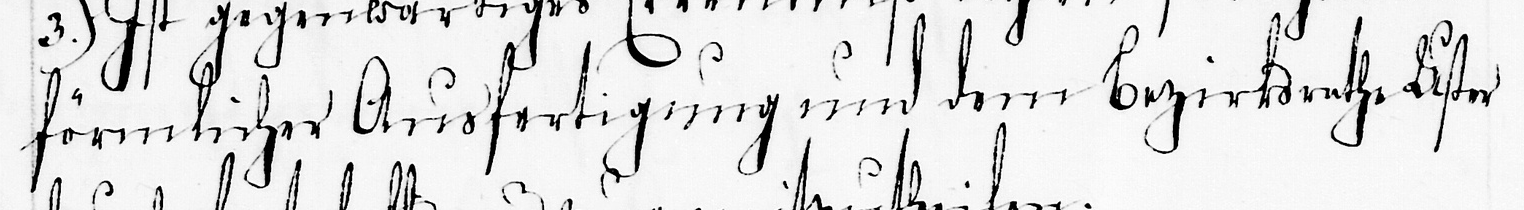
förmlicher Ausfertigung und dem Bezirksrathe Uster
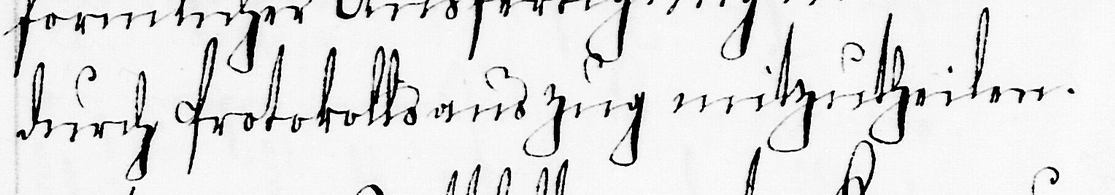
durch Protokollsauszug mitzutheilen.
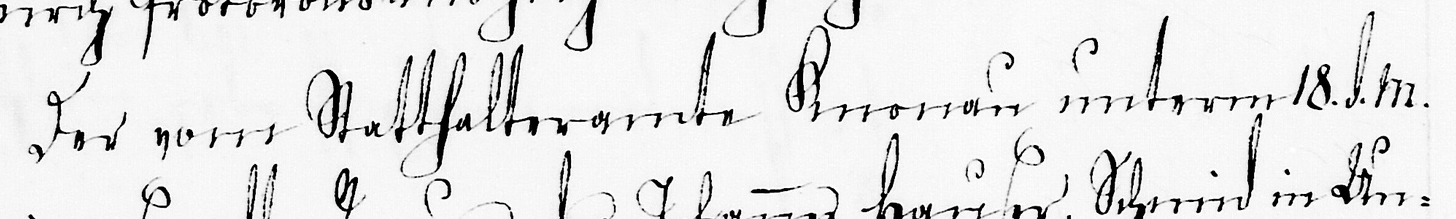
Der vom Statthalteramte Knonau unterm 18. d. M.
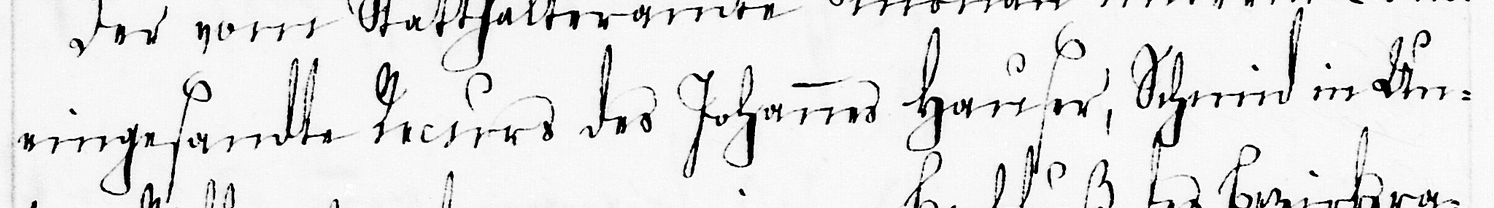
eingesandte Recurs des Johannes Hauser, Schmid in Un¬
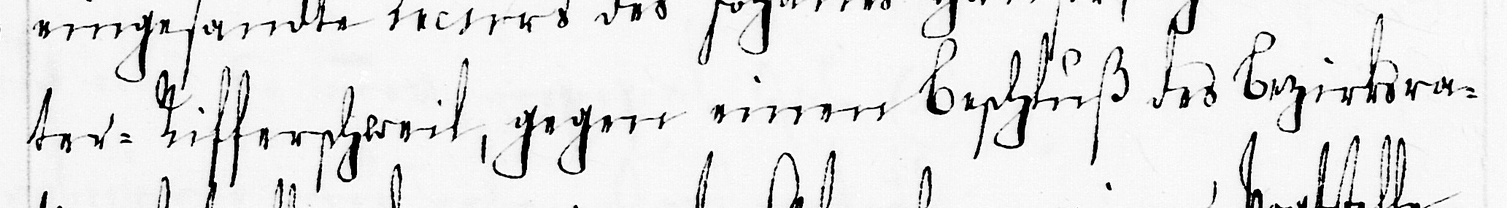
ter-Rifferschweil, gegen einen Beschluß des Bezirksra¬
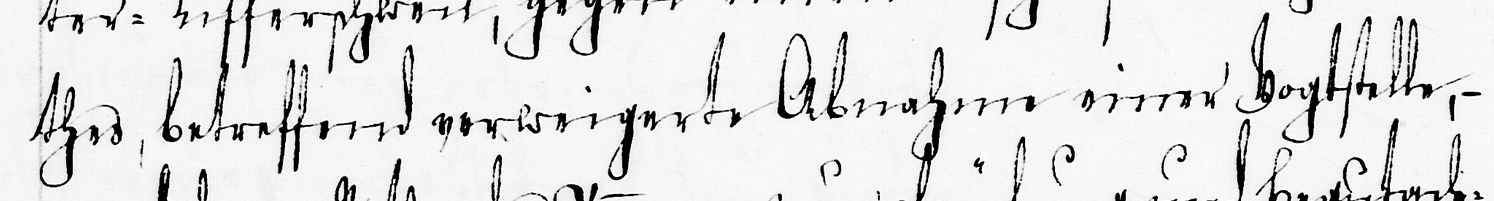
thes, betreffend verweigerte Abnahme einer Vogtstelle,
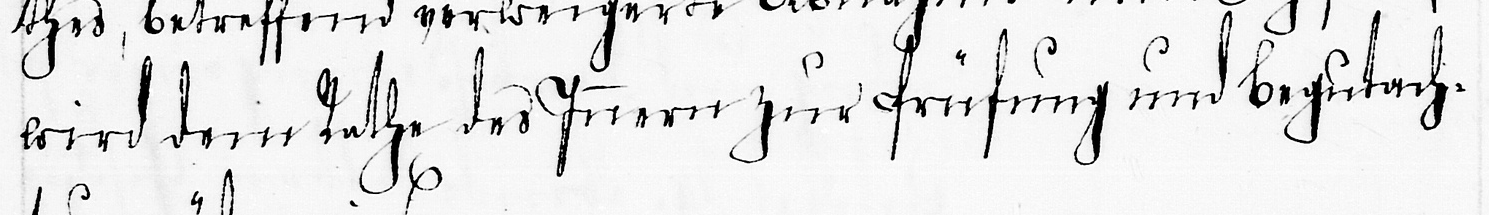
wird dem Rathe des Innern zur Prüfung und Begutach¬
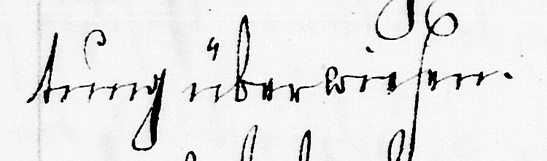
tung überwiesen.
